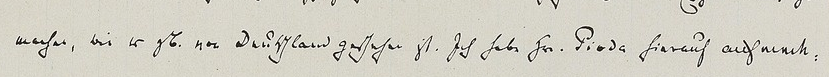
machen, wie es zB. von Deutschland geschehen ist. Ich habe Hr. Pioda hierauf aufmerk-
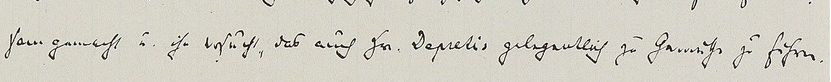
sam gemacht u. ihn ersucht, das auch Hr. Depretis gelegentlich zu Gemüthe zu führen.
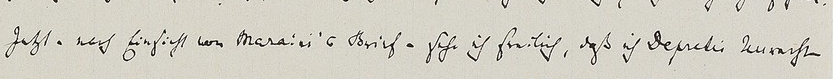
Jetzt ­ nach Einsicht von Maraini's Brief ­ sehe ich freilich, daß ich Depretis Unrecht
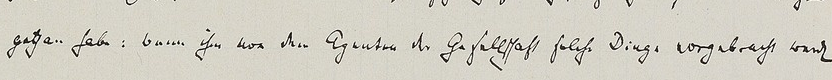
gethan habe: wenn ihm von den Agenten der Gesellschaft solche Dinge vorgebracht werden
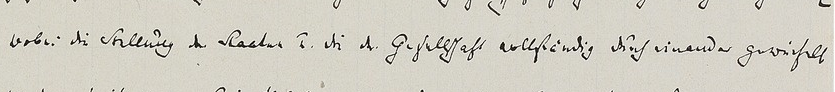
wobei die Stellung des Staates u. die der Gesellschaft vollständig durcheinander gewürfelt
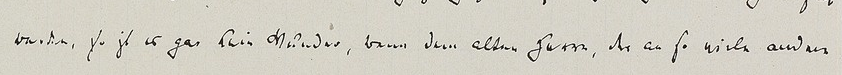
werden, so ist es gar kein Wunder, wenn dem alten Herrn, der an so viele andere
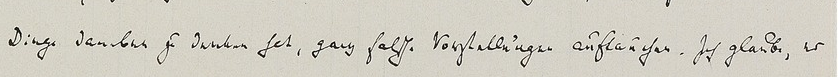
Dinge daneben zu denken hat, ganz falsche Vorstellungen auftauchen. Ich glaube, es
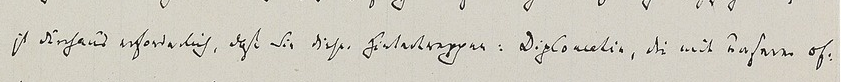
ist durchaus erforderlich, daß Sie diese Hintertreppen-Diplomatie, die mit unserer of-
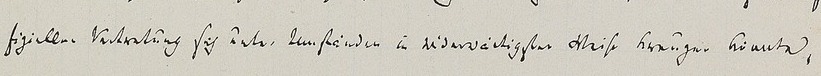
fiziellen Vertretung sich unter Umständen in widerwärtigster Weise kreuzen könnte,
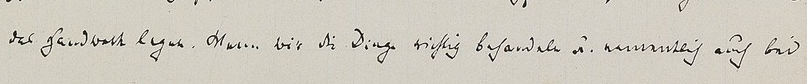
das Handwerk legen. Wenn wir die Dinge richtig behandeln u. namentlich auch bei
